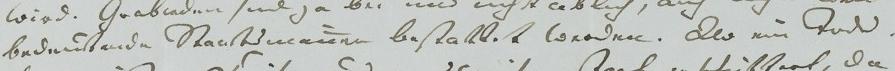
bedeutende Staatsmänner bestattet werden. Wo ein Todes-
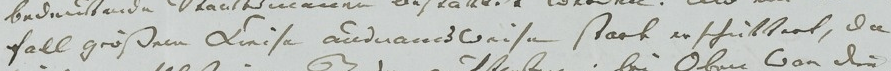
fall größere Kreise ausnamsweise stark erschüttert, da
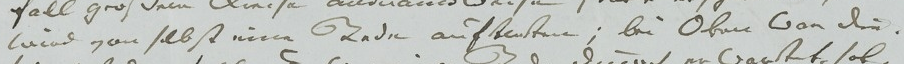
wird von selbst eine Rede auftreten; bei Oken war die-
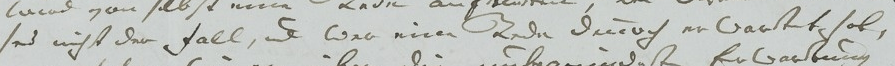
ses nicht der Fall, und wer eine Rede dennoch erwartet hat,
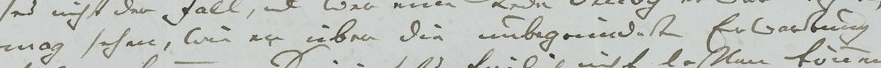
mag sehen, wie er über die unbegründete Erwartung
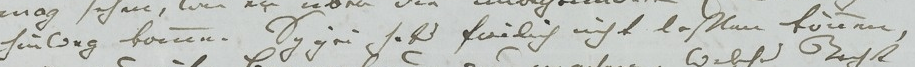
hinweg komme. Spyri hats freilich nicht lassen können,
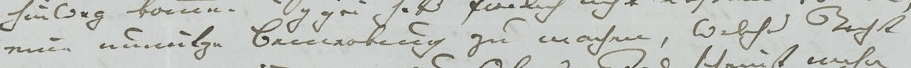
eine unnütze Bemerkung zu machen, welches Recht
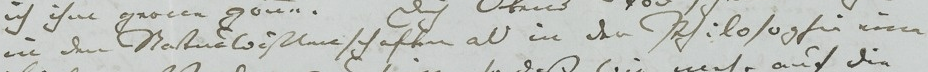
in den Naturwissenschaften als in der Philosophie eine
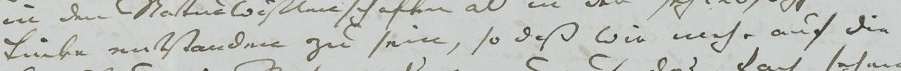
Lücke entstanden zu sein, so daß wir mehr auf die
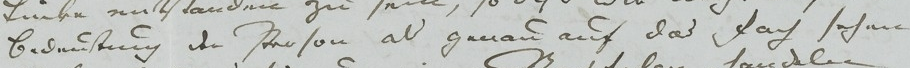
Bedeutung der Person als genau auf das Fach sehen
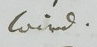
wird.
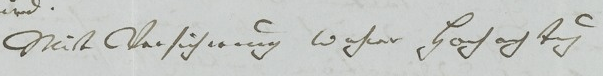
Mit Versicherung wahrer Hochachtung
